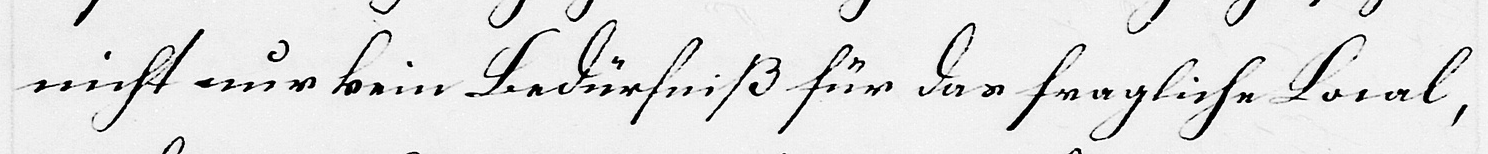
nicht nur kein Bedürfniß für das fragliche Local,
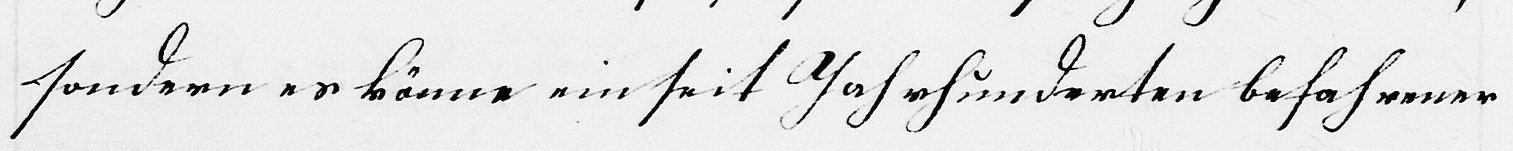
sondern es könne ein seit Jahrhunderten befahrener
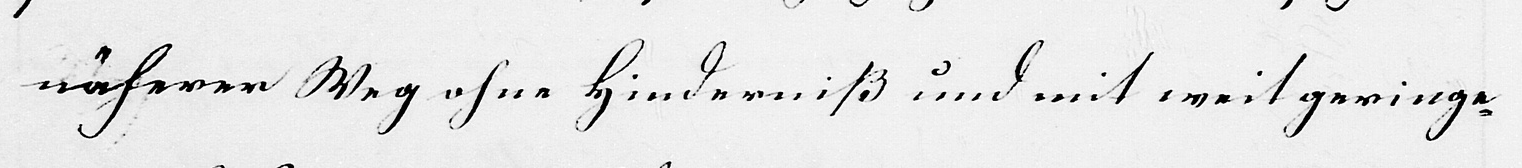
näherer Weg ohne Hinderniß und mit weit geringe¬
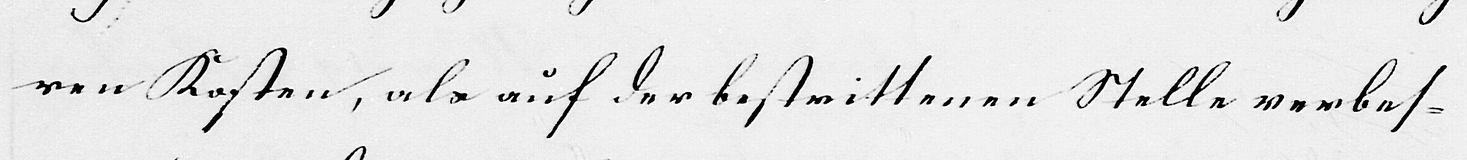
ren Kosten, als auf der bestrittenen Stelle verbes¬
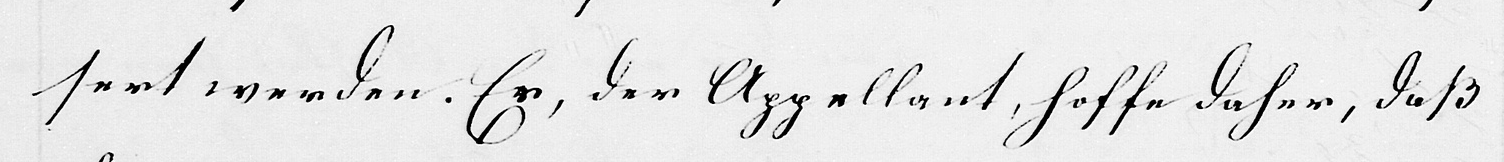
sert werden. Er, der Appellant, hoffe daher, daß
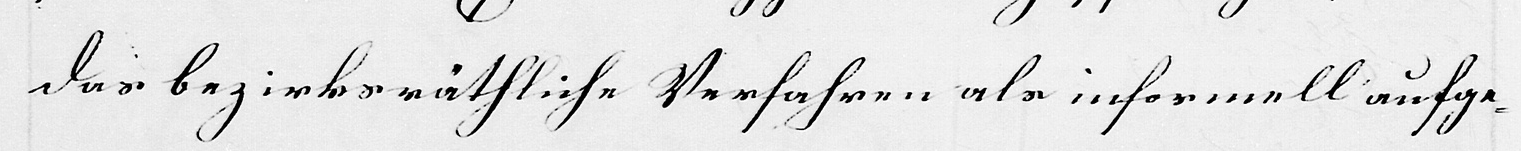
das bezirksräthliche Verfahren als informell aufge¬
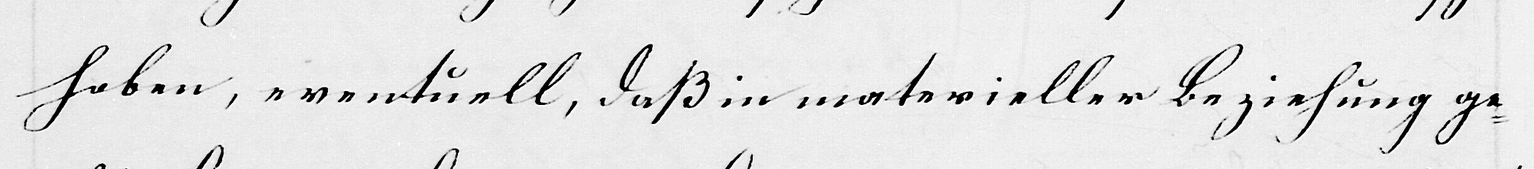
hoben, eventuell, daß in materieller Beziehung ge¬
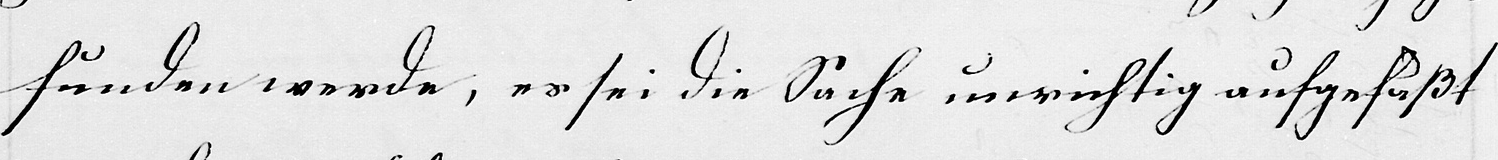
funden werde, es sei die Sache unrichtig aufgefaßt
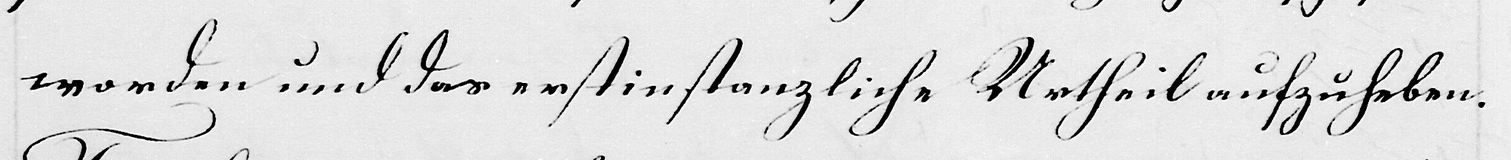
worden und das erstinstanzliche Urtheil aufzuheben.
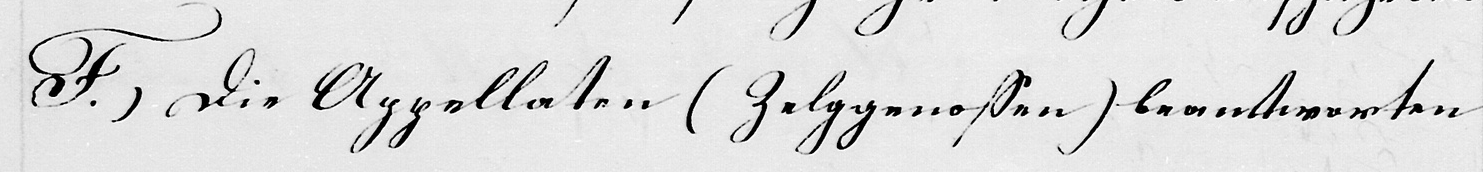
F.) Die Appellaten (Zelggenoßen) beantworten
